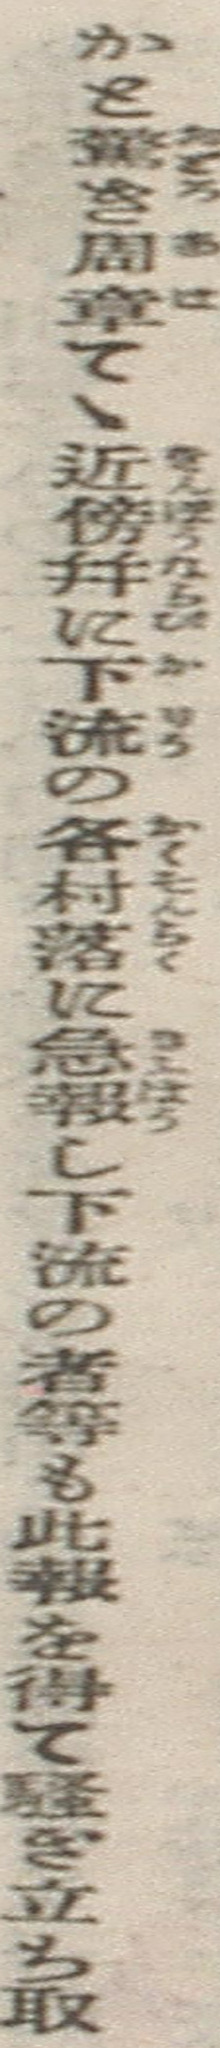かと驚き周章てゝ近傍并に下流の各村落に急報し下流の者等も此報を得て騒ぎ立ち取
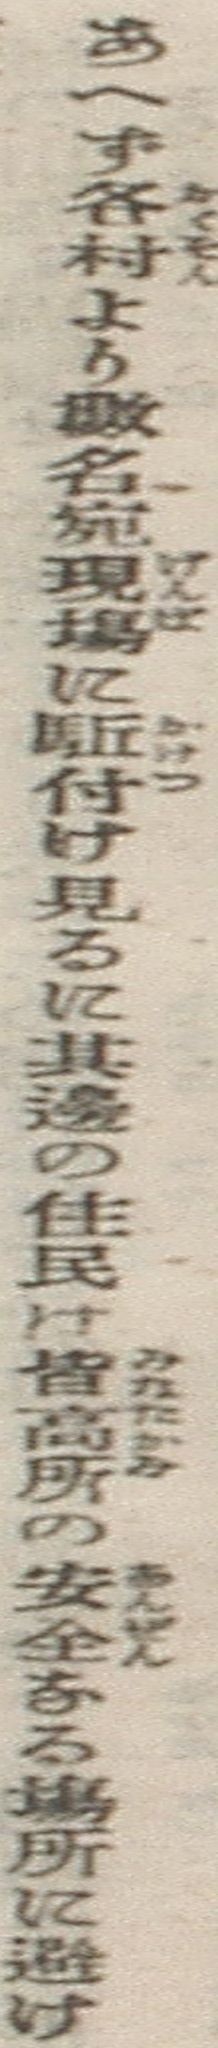あへず各村より数名宛現場に駆付け見るに其邊の住民は皆高所の安全なる場所に避け
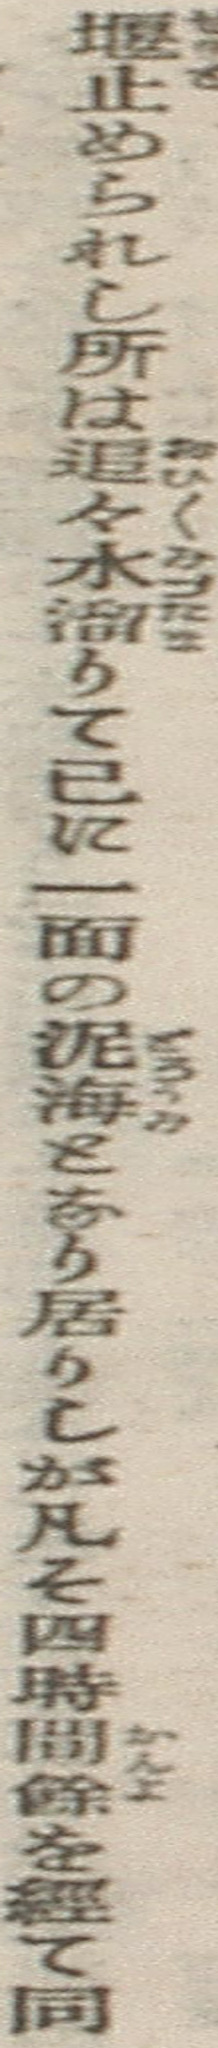堰止められし所は追々水溜りて已に一面の泥海となり居りしが凡そ四時間餘を経經て同
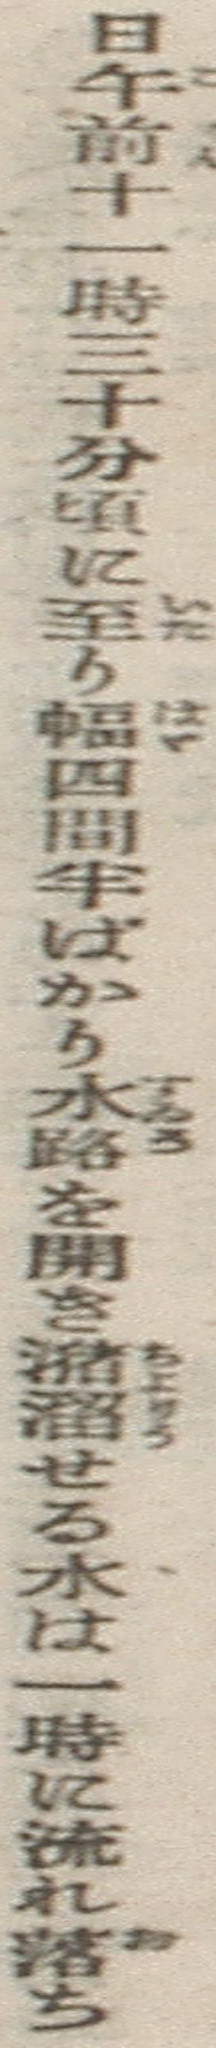日午前十一時三十分頃に至り幅四間半ばかり水路を開き瀦溜せる水一時に流れ落ち
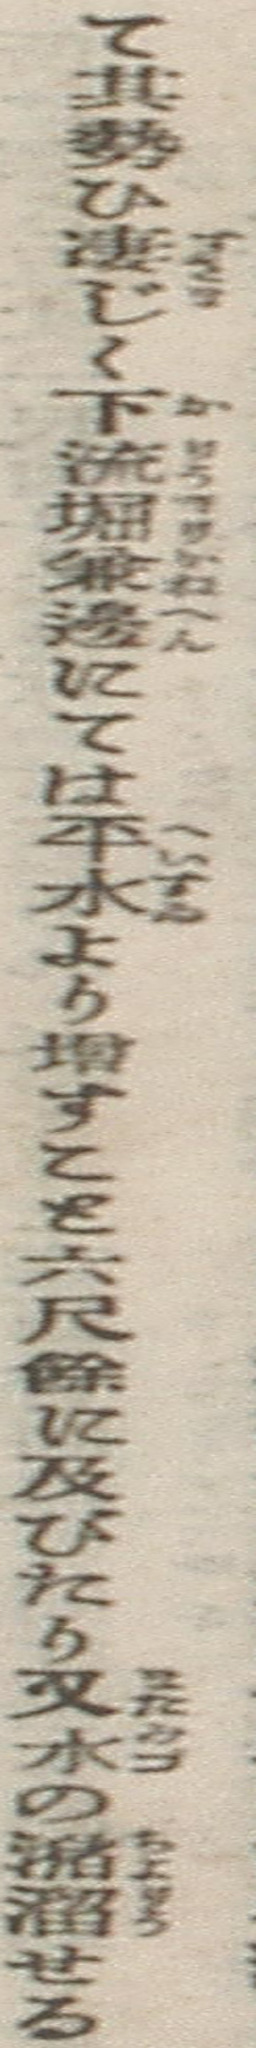て其勢ひ凄じく下流堀兼邊にては平水より増すこと六尺餘に及びたり又水の瀦溜せる

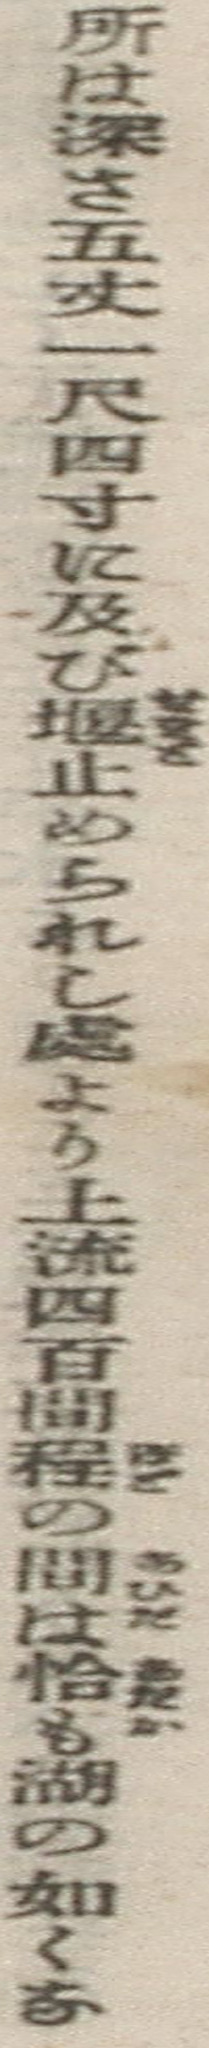所は深さ五丈一尺四寸に及び堰止められし處より上流四百間程の間は恰も湖の如くな
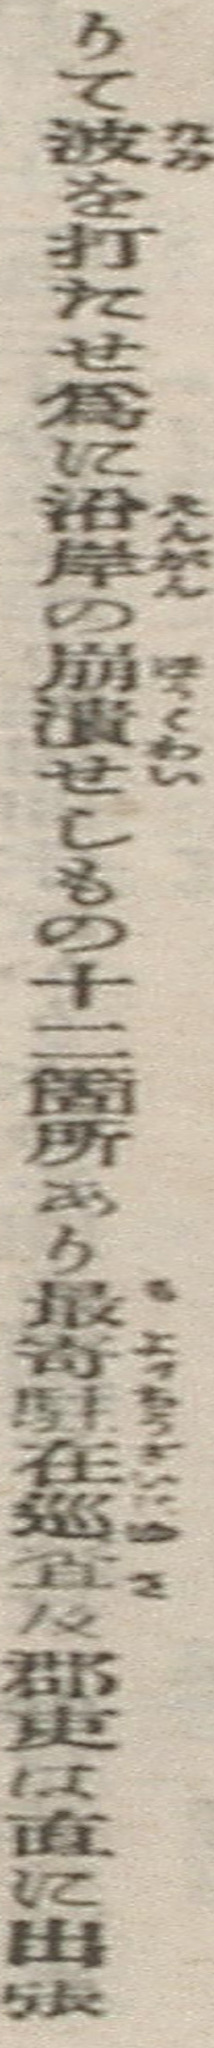りて波を打たせ為に沿岸の崩潰せしもの十二ヶ所あり最寄駐在巡査及郡吏は直に出張
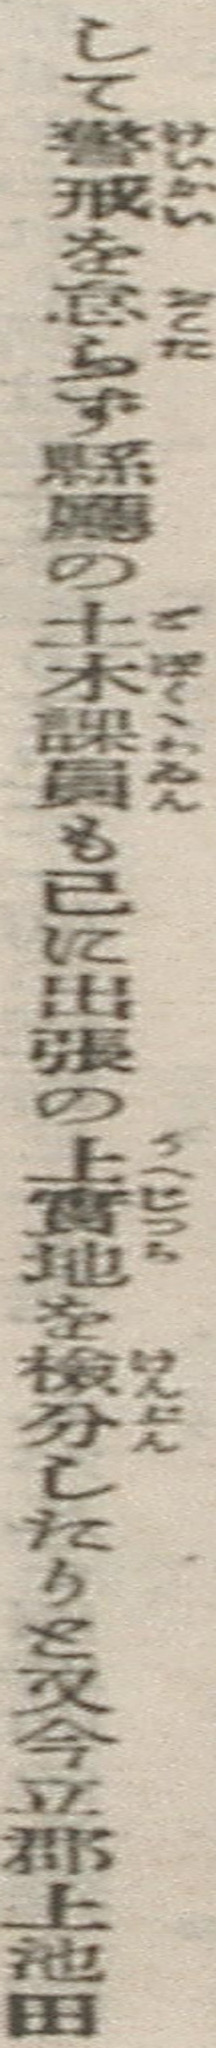して警戒を怠らず縣廰の土木課員も已に出張の上實地を検分したりと又今立郡上池田
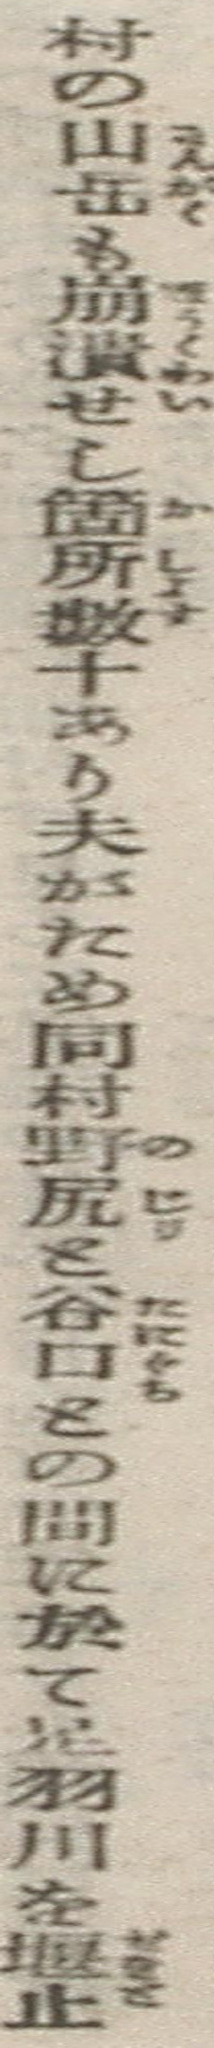村の山岳も崩潰せし箇所数十あり夫がため同村野尻と谷口との間に於て足羽川を堰止
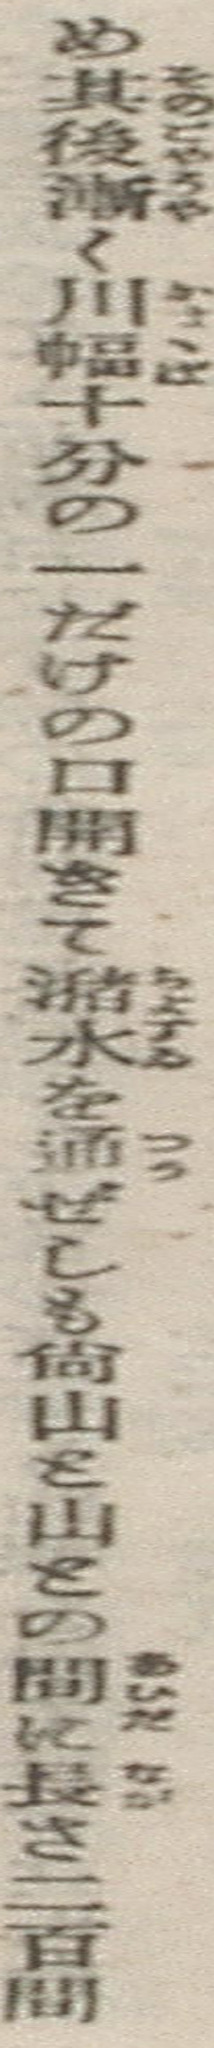め其後漸く川幅十分の一だけ口開きて瀦水を通ぜしも尚山と山との間に長さ二百間
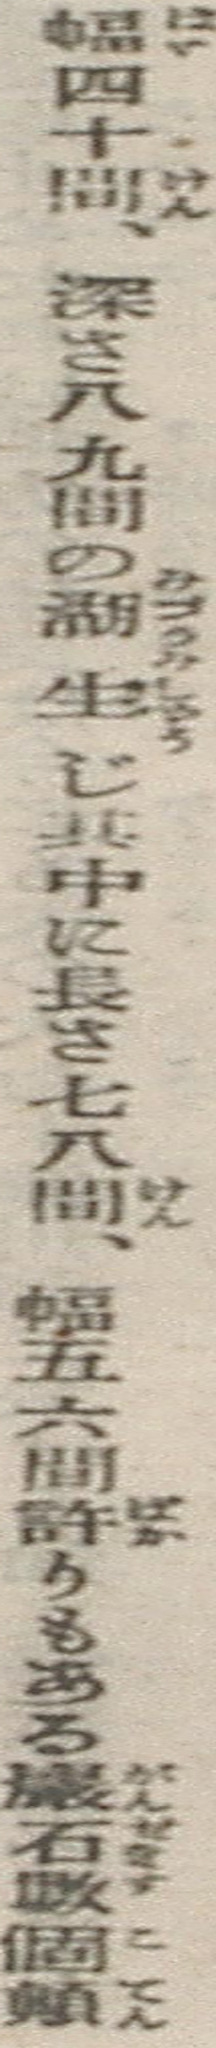幅四十間、深さ八九間の湖生じ其中に長さ七八間、幅五六間許りもある巖石数個顛
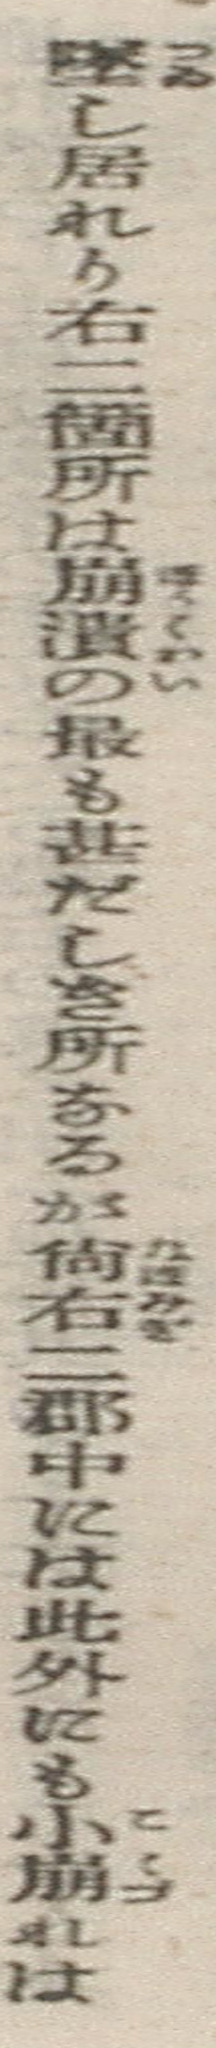墜し居れり右二箇所は崩潰の最も甚だしき所なるが尚右二郡中には此外にも小崩れは
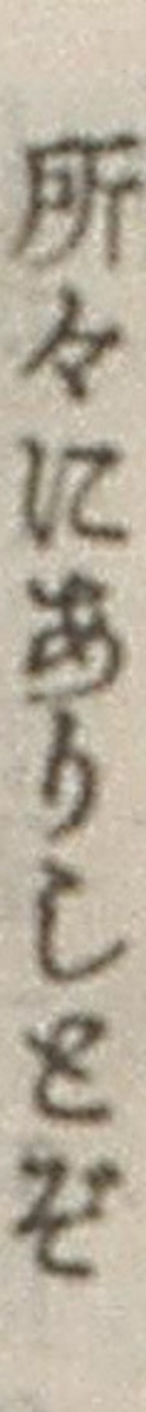所々にありしとぞ
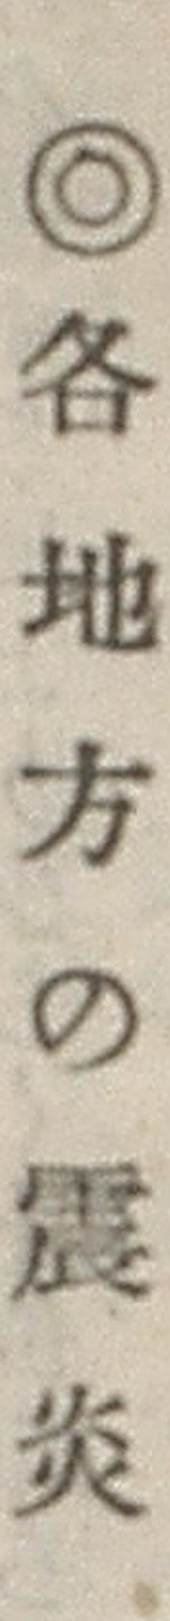◎各地方の震災
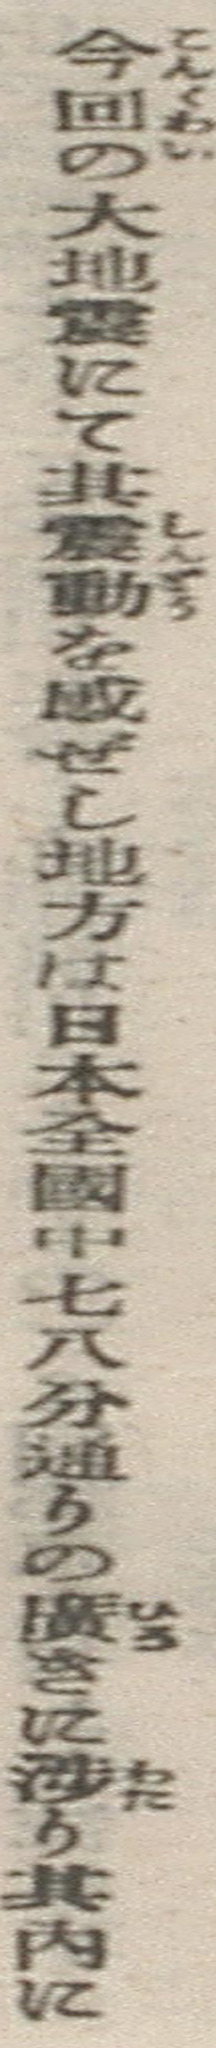今回の大地震にて其震動を感ぜし地方は日本全國中七八分通りの廣きに渉り其内に
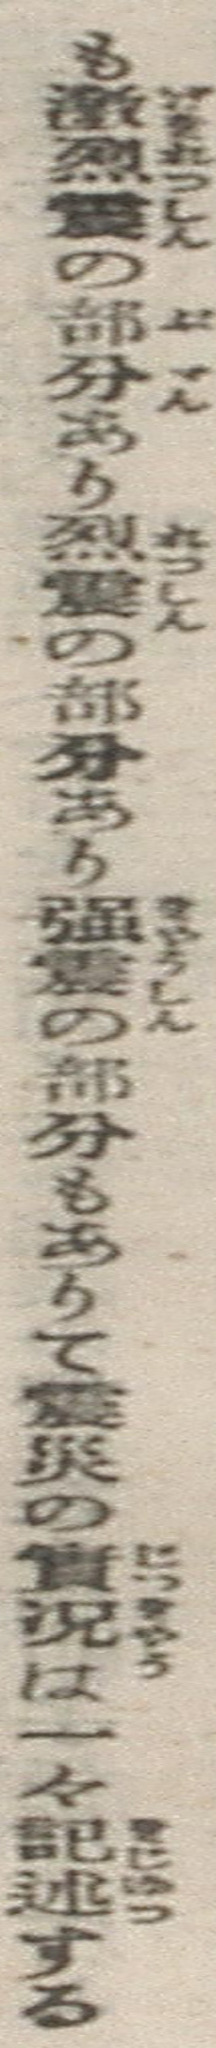も激烈震の部分あり烈震の部分あり強震の部分もありて震災の實況は一々記述きじゆつする
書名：愛知岐阜福井三県　大地震見聞録（内題）
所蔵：東京大学地震研究所図書室 Earthquake Research Institute Library, The University of Tokyo, JAPAN
